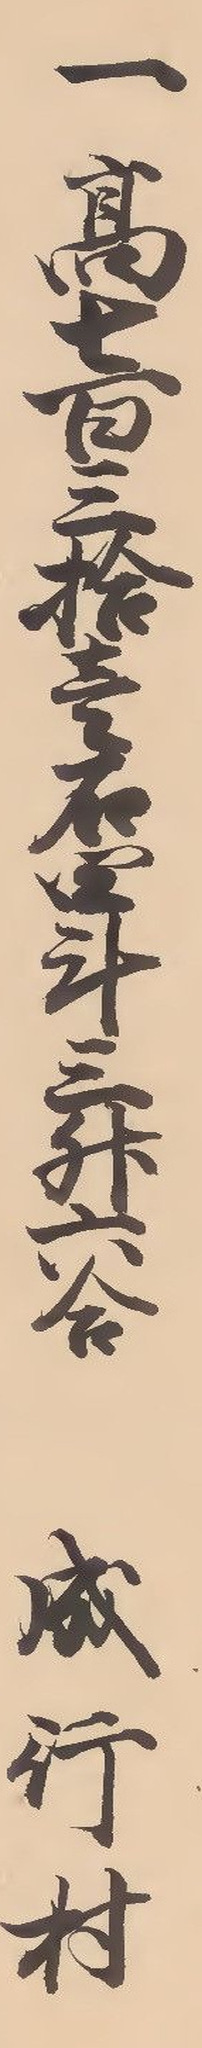一高七百三拾壱石四斗三升六合成行村
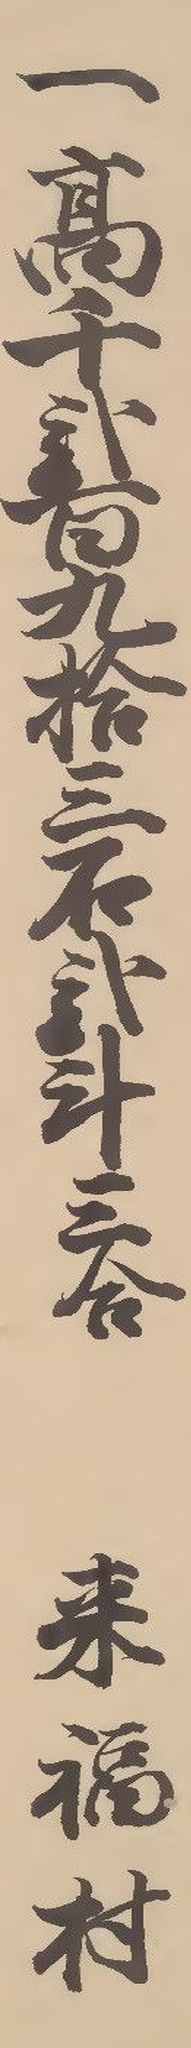一高千弐百九拾三石弐斗三合来福村
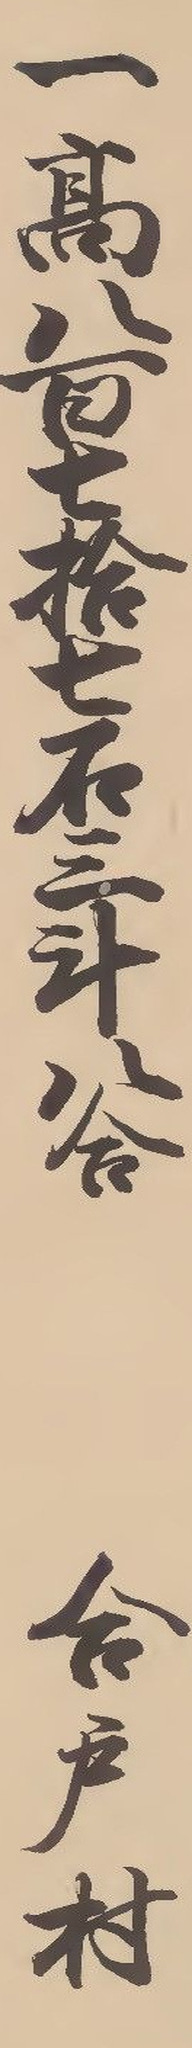一高八百七拾七石三斗八合合戸村
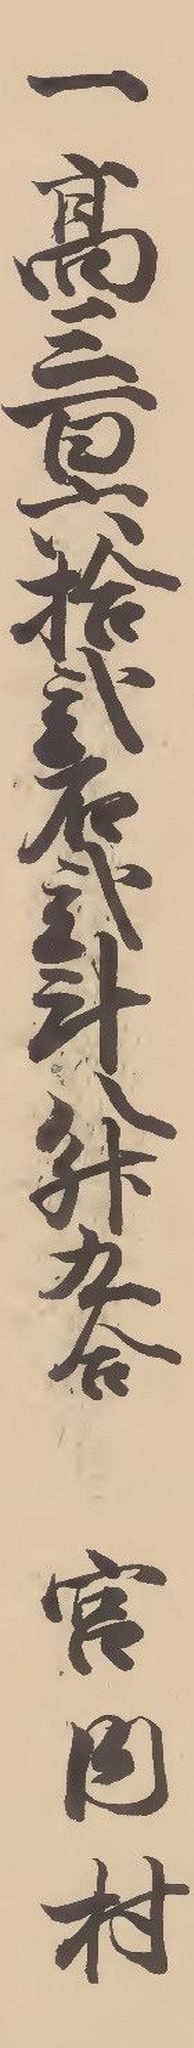一高三百六拾弐石弐斗八升九合宮内村

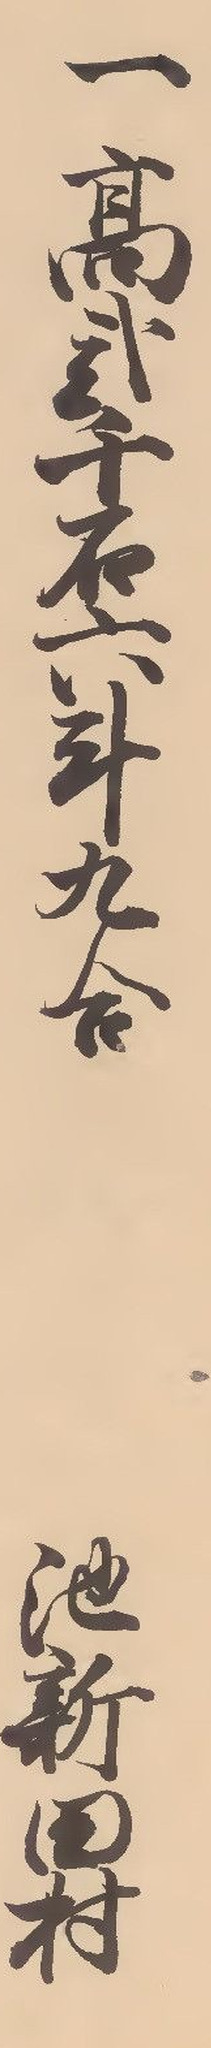一高弐千石六斗九合池新田村
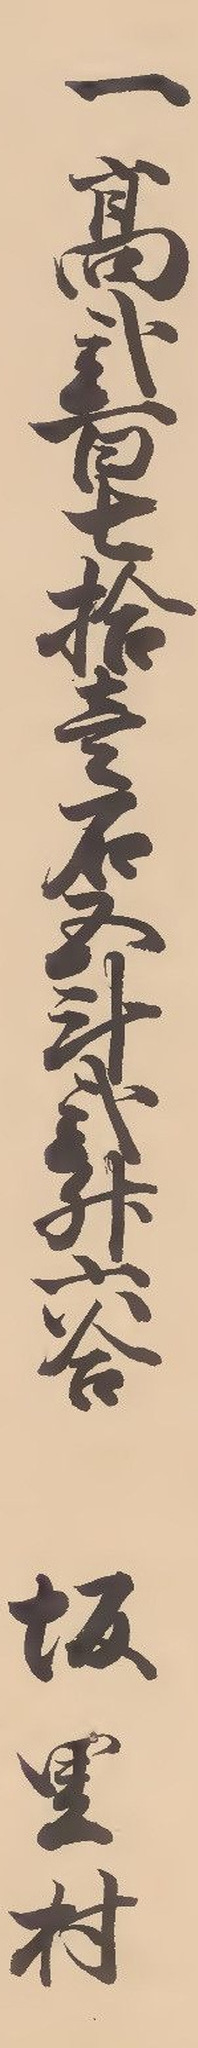一高弐百七拾壱石五斗弐升六合坂里村
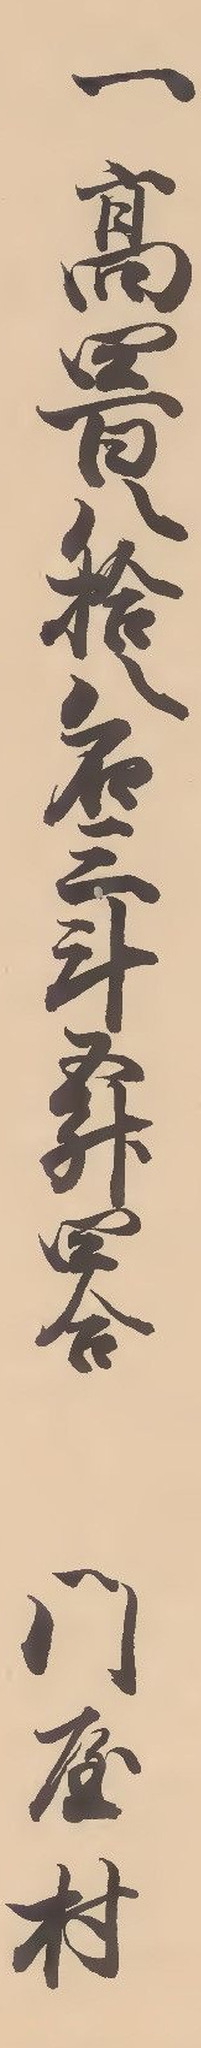一高四百八拾八石三斗五升四合門屋村
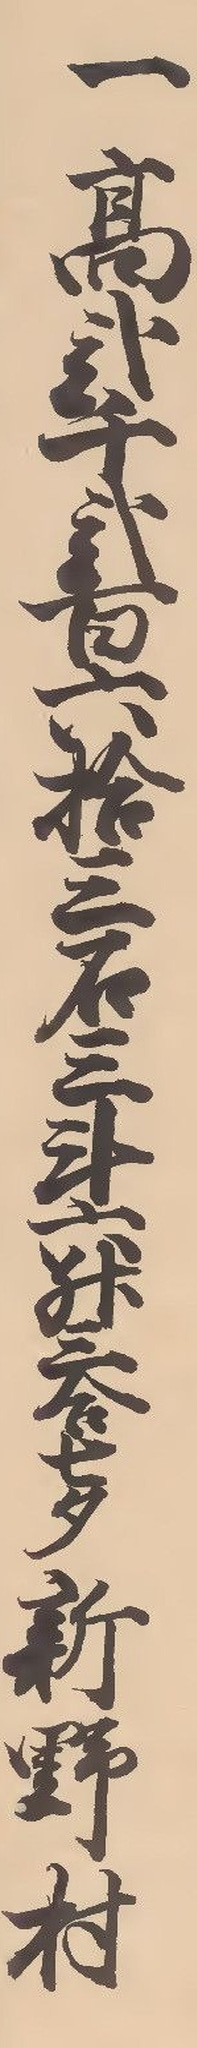一高弐千弐百六拾三石三斗六升三合七勺新野村
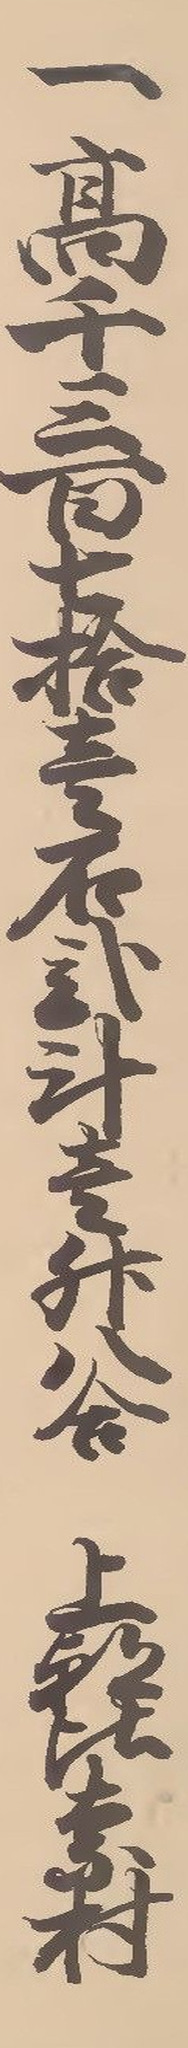一高千三百七拾壱石弐斗壱升八合上朝比奈村
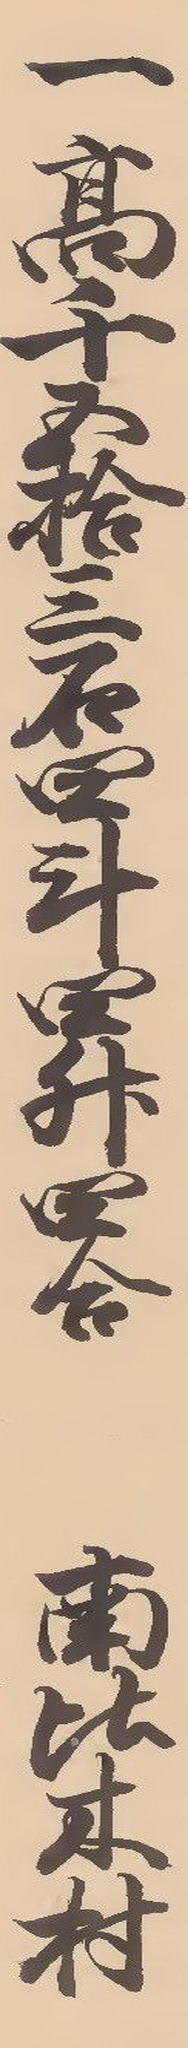一高千五拾三石四斗四升四合南比木村
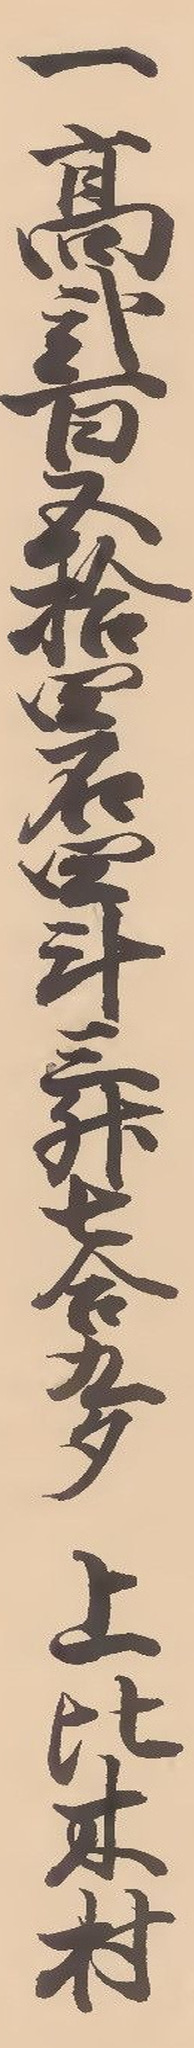一高弐百五拾四石四斗三升七合九勺上比木村

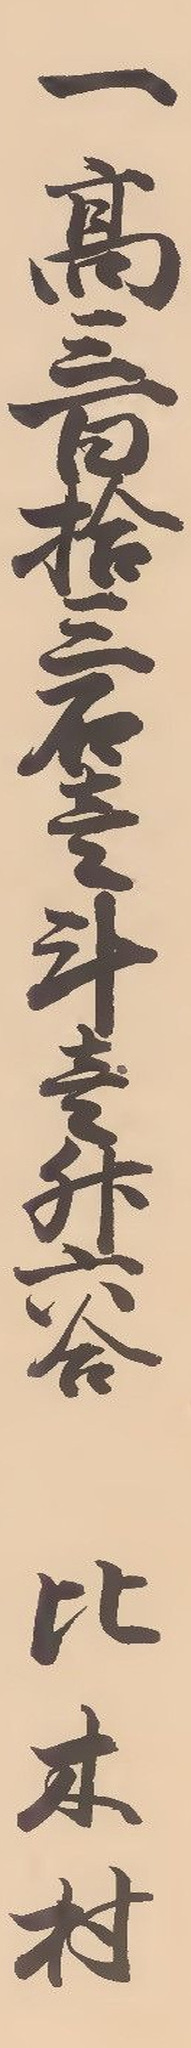一高三百拾三石壱斗壱升六合比木村
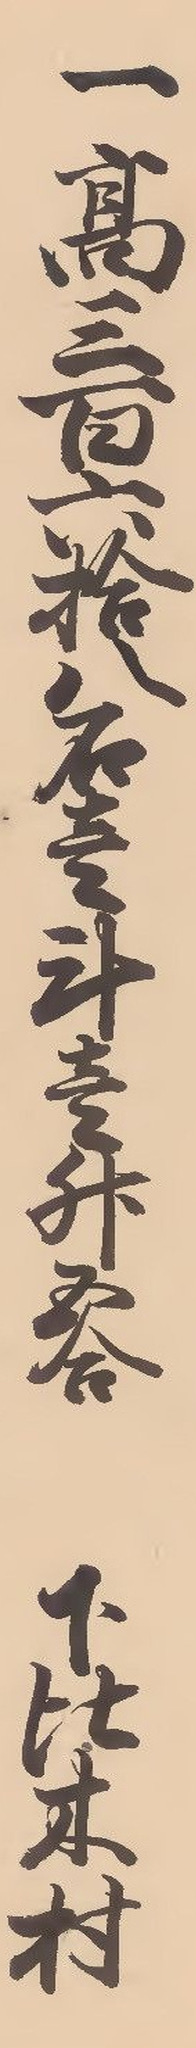一高三百六拾八石壱斗壱升五合下比木村
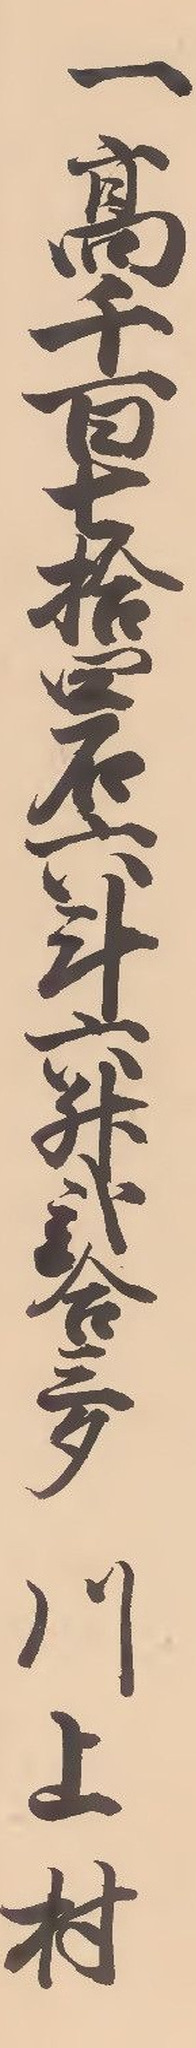一高千百七拾四石六斗六升弐合三勺川上村
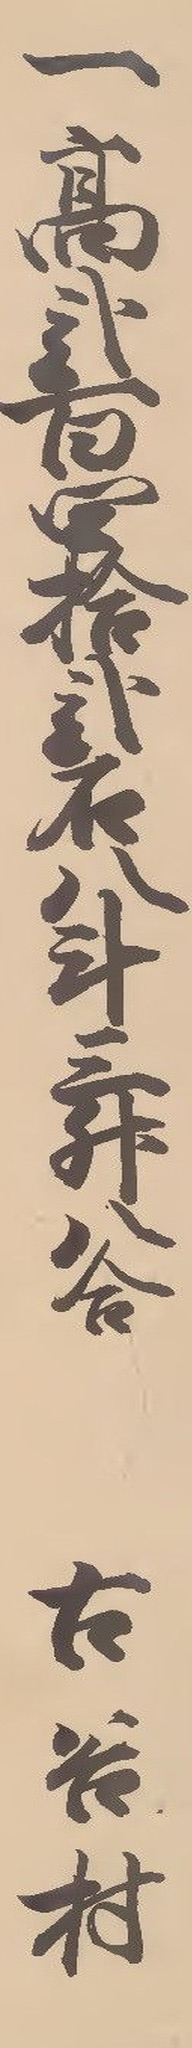一高弐百四拾弐石八斗三升八合古谷村
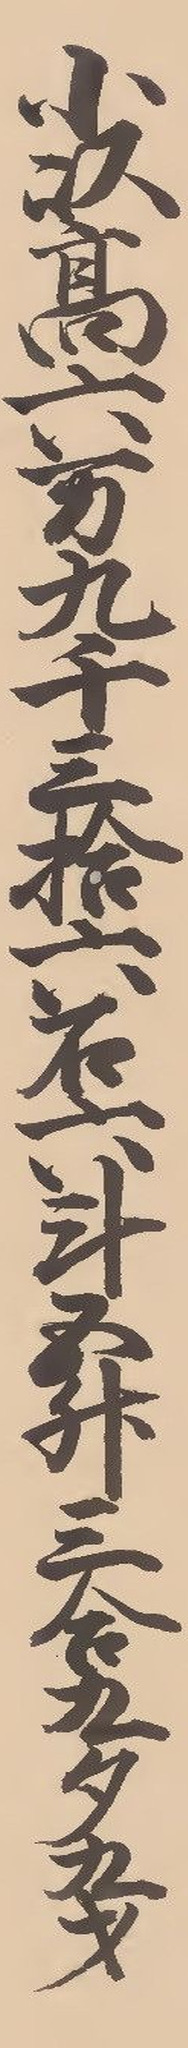小以高六万九千三拾六右六斗五升三合九勺九才
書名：遠江国郷帳
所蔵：国立公文書館 National Archives of Japan
